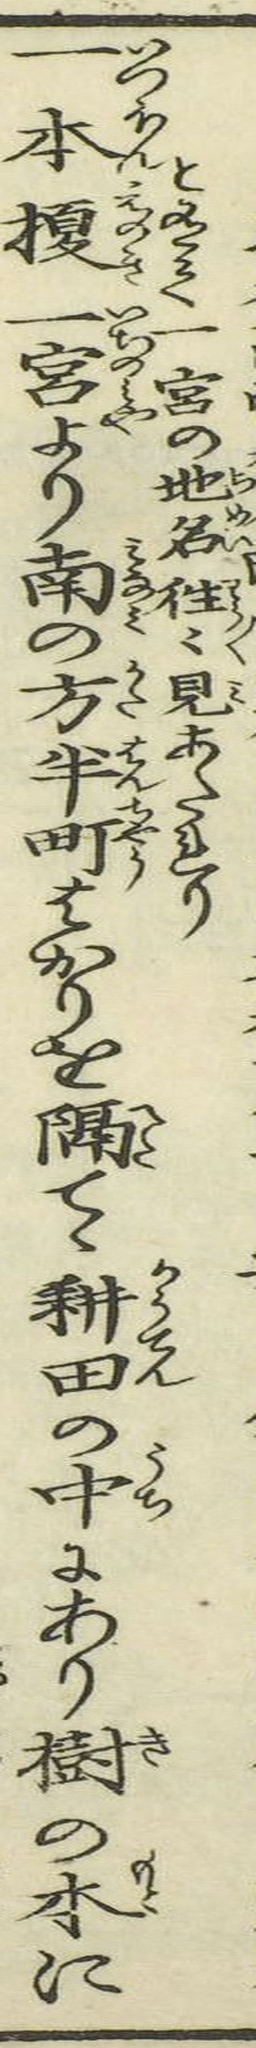一本榎一宮より南の方半町はかりを隔てゝ耕田の中にあり樹の本に
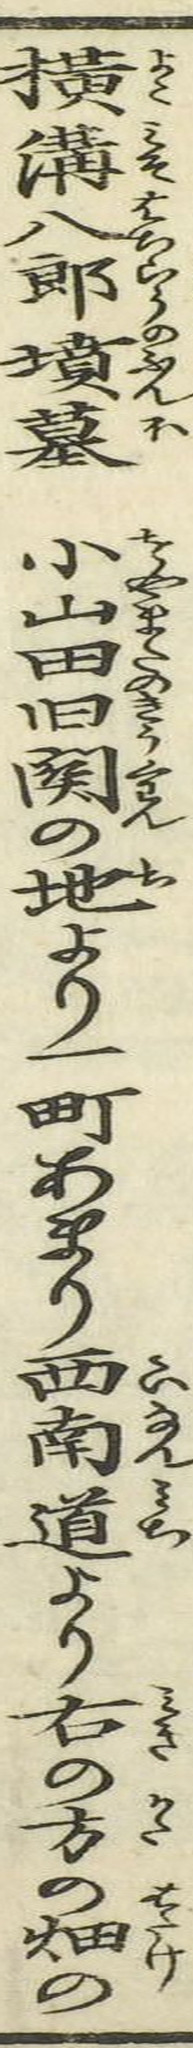横溝八郎墳墓小山田旧関の地より一町あまり西南道より右の方畑の
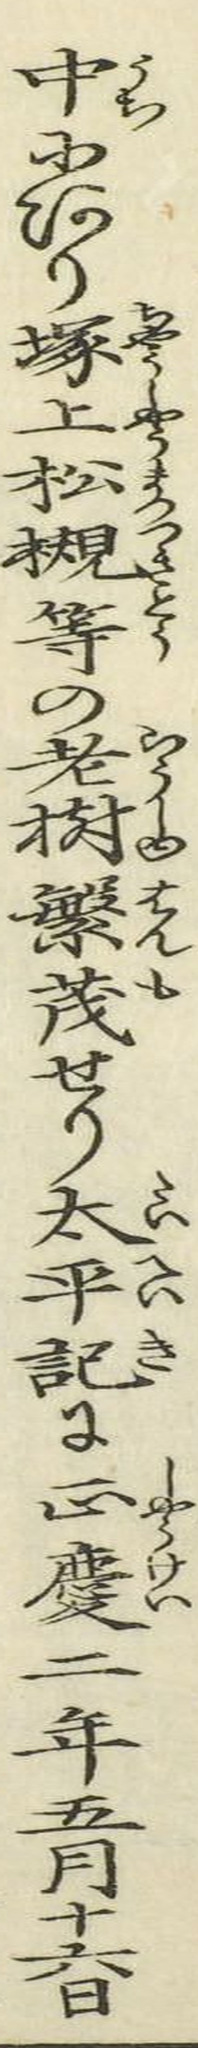中にあり塚上松槻等の老樹繁茂せり太平記に正慶二年五月十六日
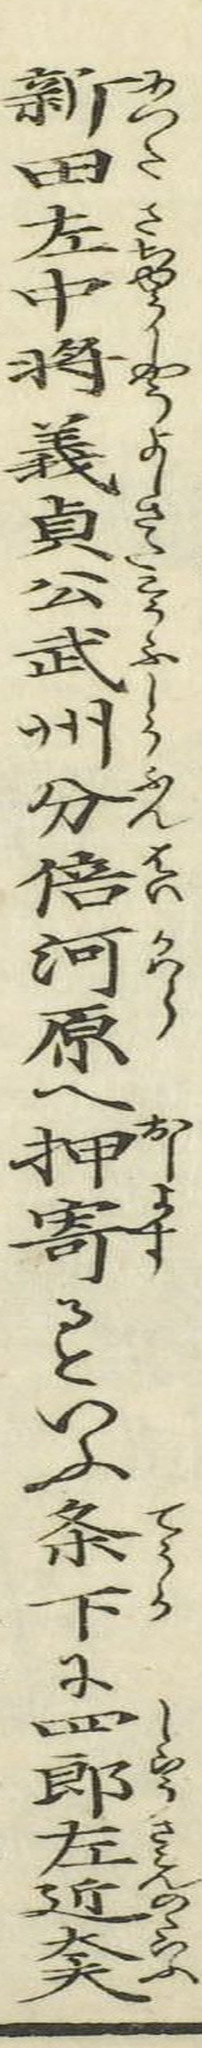新田左中将義貞公武州分倍河原へ押寄るといふ条下に四郎左近太夫
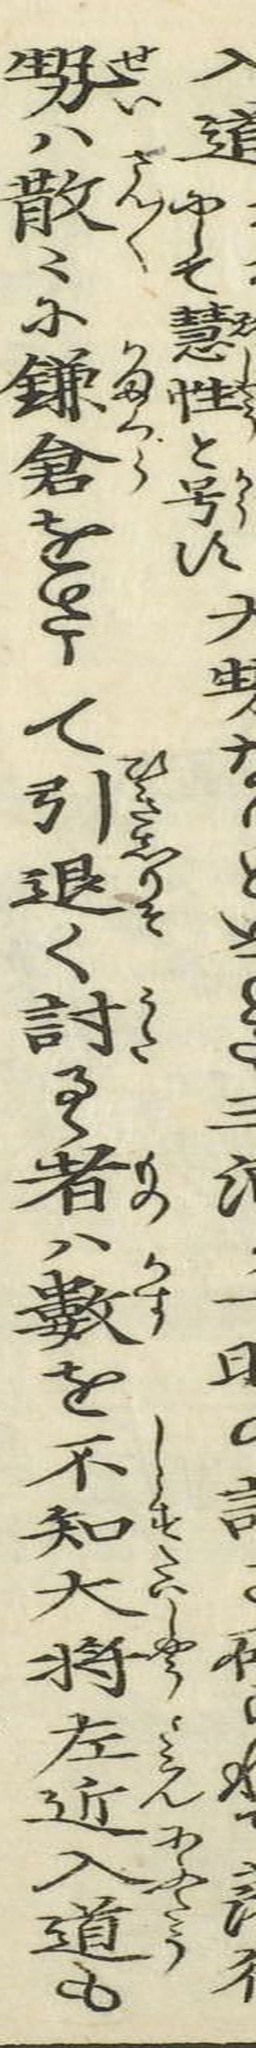勢は散々に鎌倉をさして引退く討るゝ者は数を不知大将左近入道も
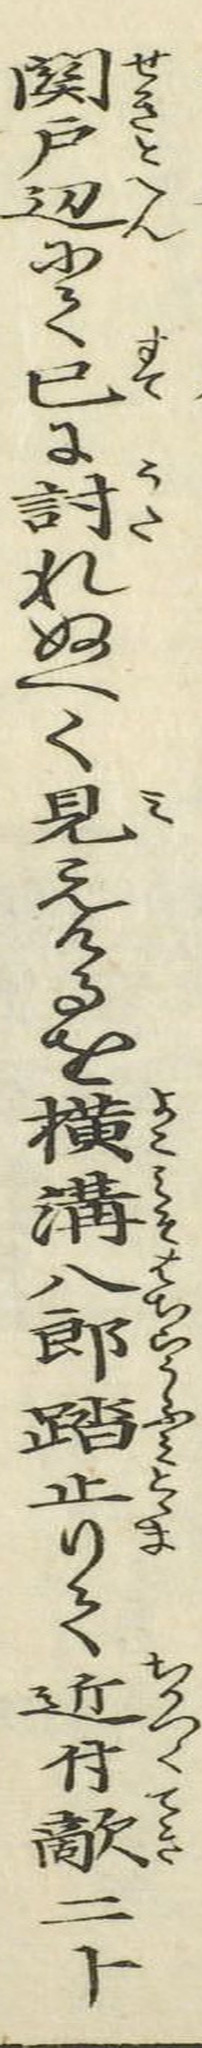関戸辺にて已に討れぬへく見えけるを横溝八郎踏止りて近付敵二十
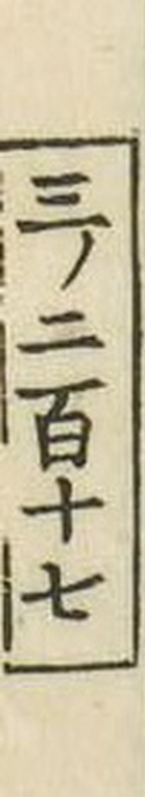三ノ二百十七
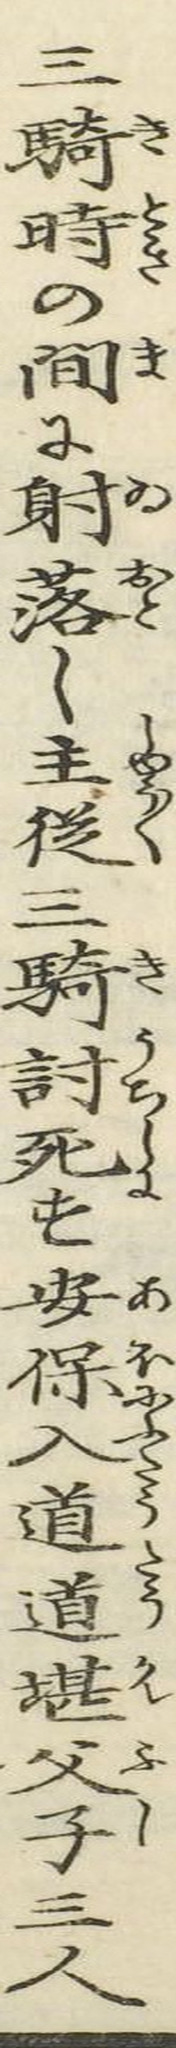三騎時の間に射落し主従三騎討死す安保入道道堪父子三人
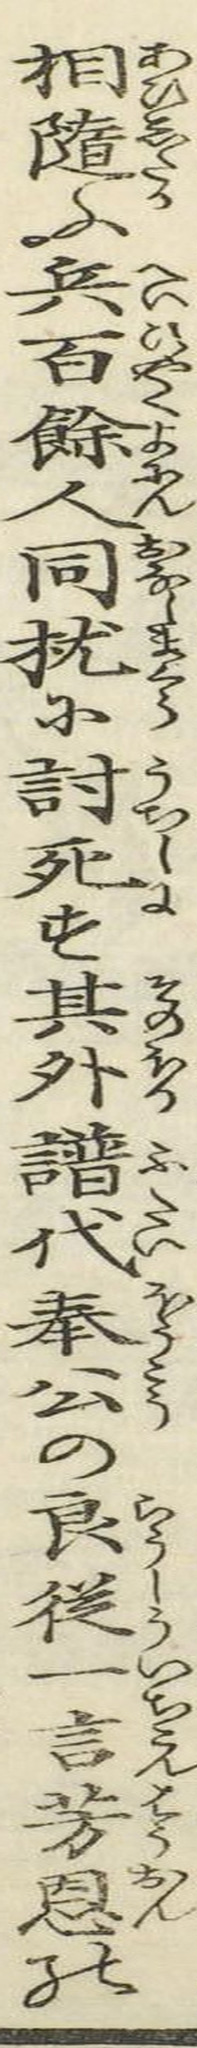相随ふ兵百余人同枕に討死す其外譜代奉公の良従一言芳恩の
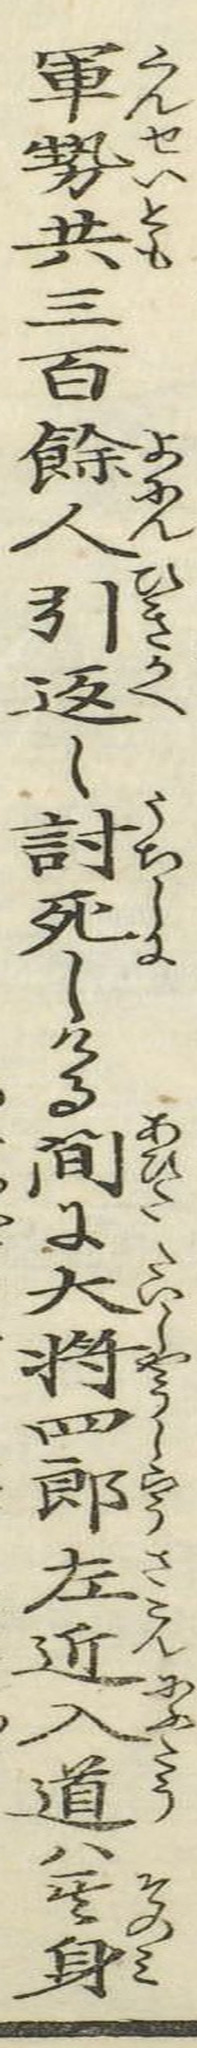軍勢共三百余人引返し討死しける間に大将四郎左近入道は其身
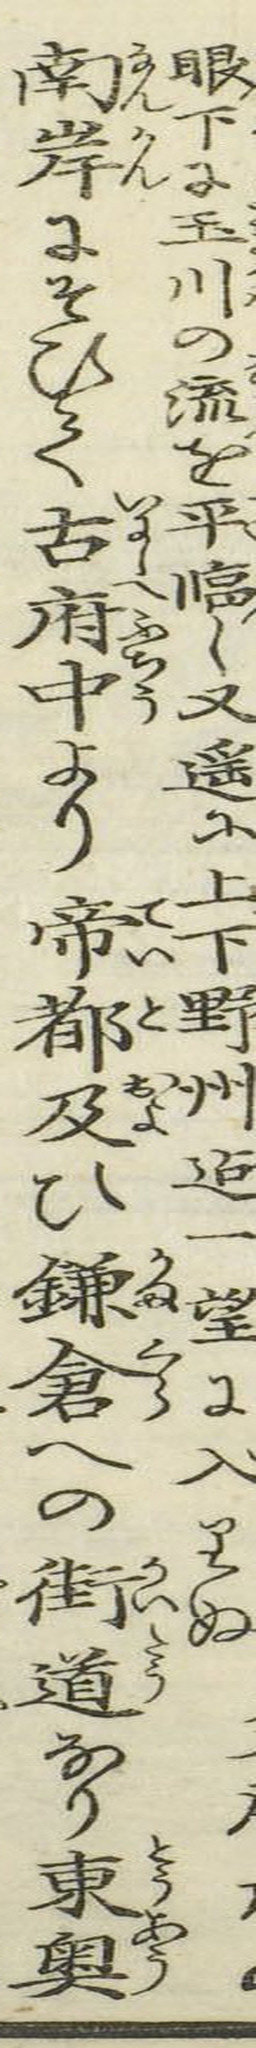南岸にそひて古府中より帝都及ひ鎌倉への街道なり東奥
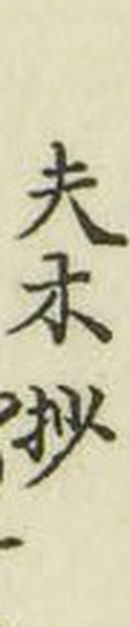夫木抄
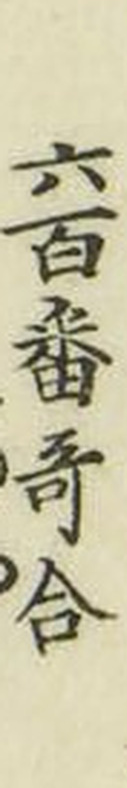六百番哥合
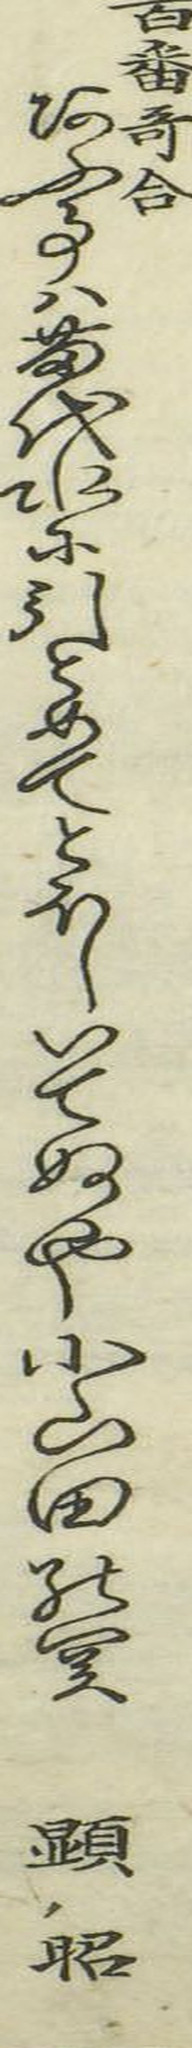あふ事は苗代水に引とめてとほしいてぬや小山田の関顕昭
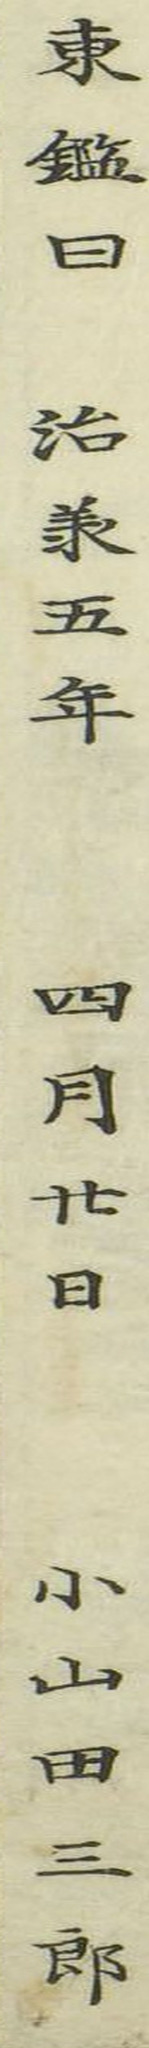東鑑曰治承五年四月廿日小山田三郎

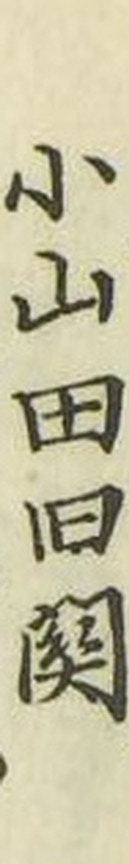小山田旧関
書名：江戸名所図会 20巻 巻之10
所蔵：東京学芸大学教育コンテンツアーカイブ
